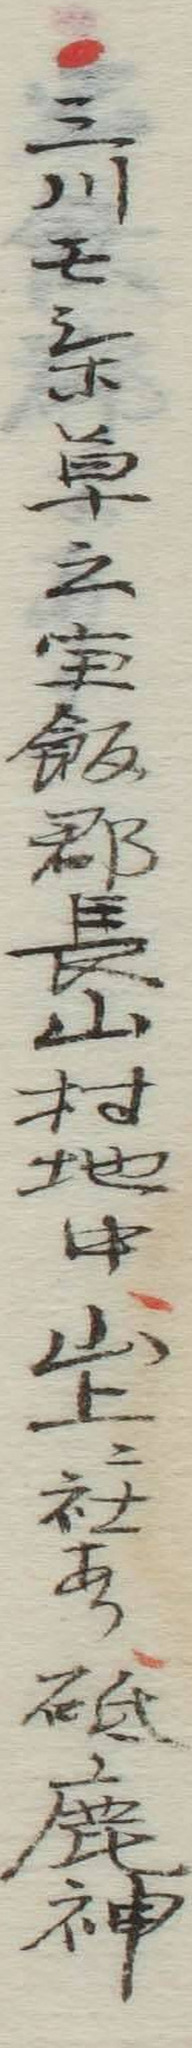○本宮山●三川モシホ草云宝飯郡長山村地中、山上ニ社あり、砥鹿神
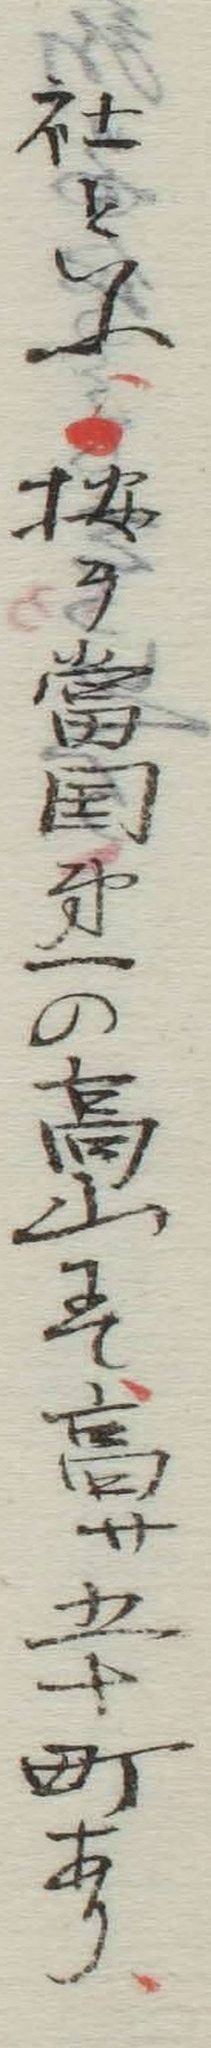社といふ、●按に当国第一の高山にて、高サ五十町あり、
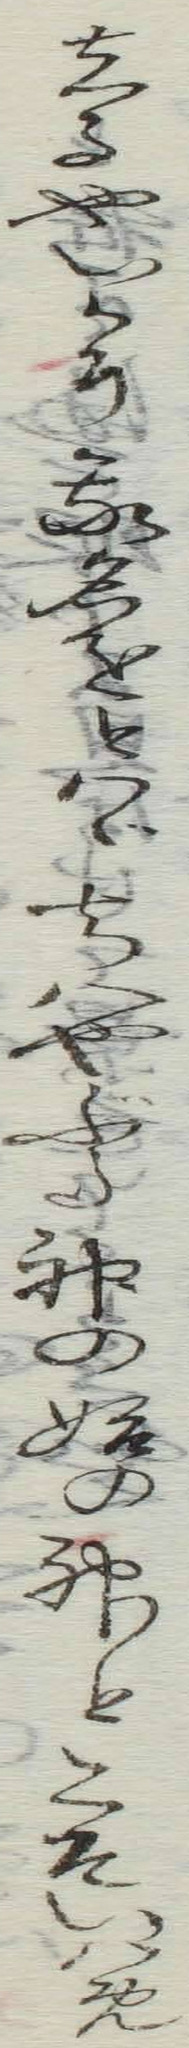しるやいかに我名をとはゞちはやぶる神の始の神とこそいはめ
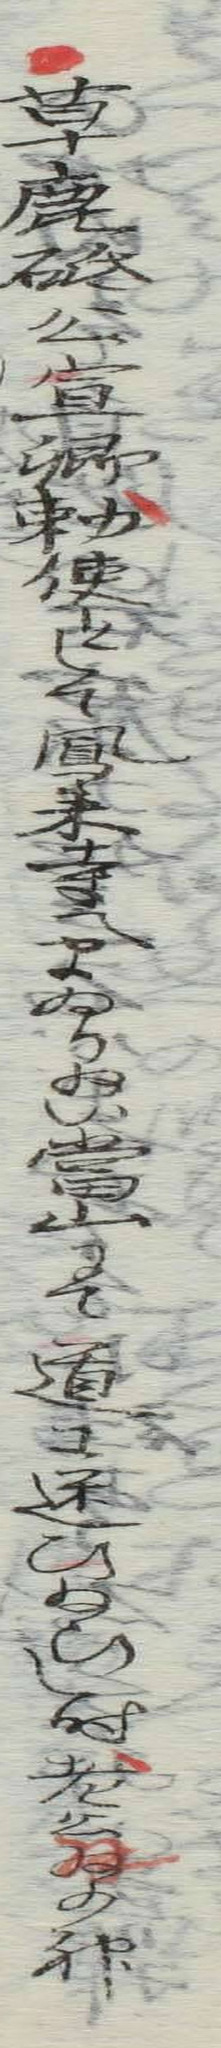●草鹿砥公宣卿、勅使として鳳来寺へまゐり給ひ当山にて道に迷ひ給ひし時、老翁の神
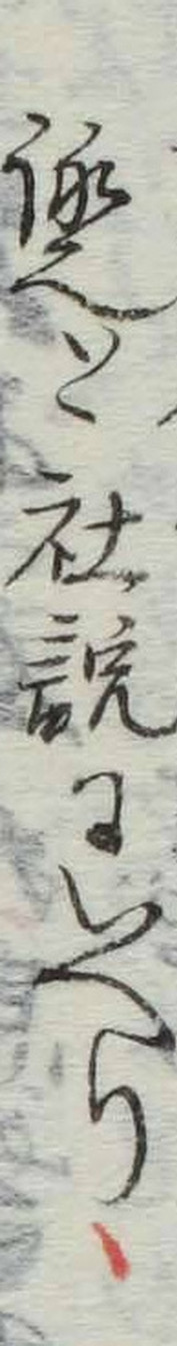詠也と社説にいへり、
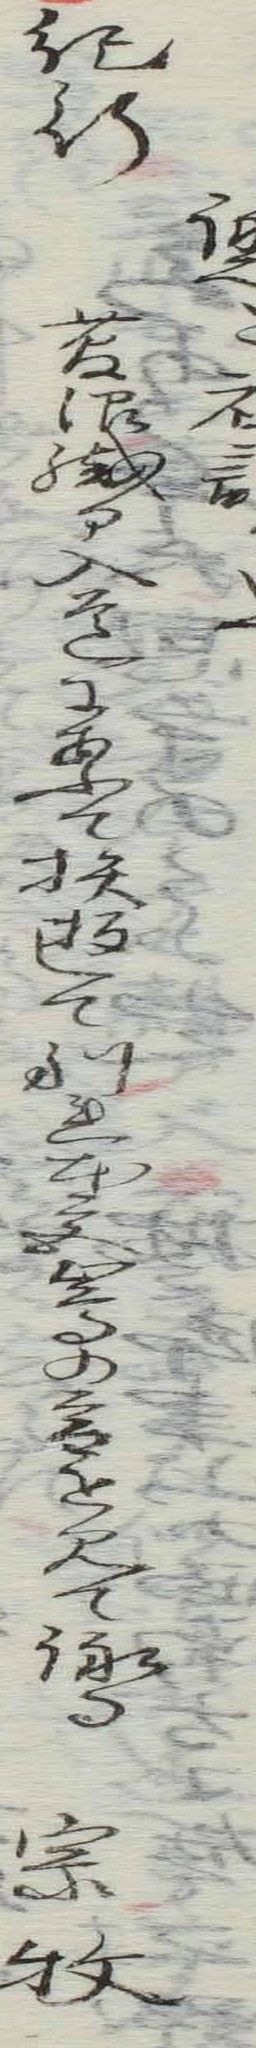○紀行菅沼織部入道にあふて挨拶して別れ本宮嵩の雪を見て詠る宗牧
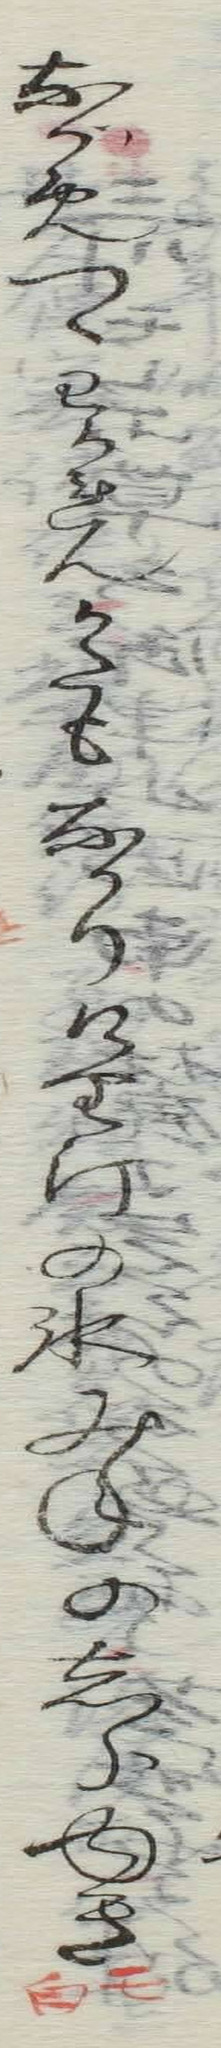ながめつゝわかれんかたもなかりけむ汀の氷みねのしらゆきモ白
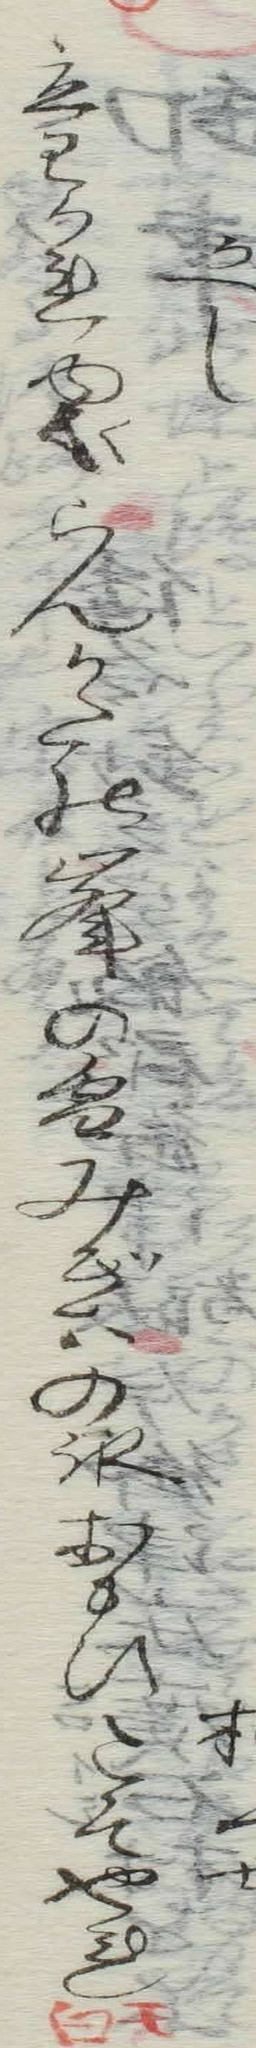立わかれゆくらんかたの峰の雪みぎはの氷おもひこそやれモ白
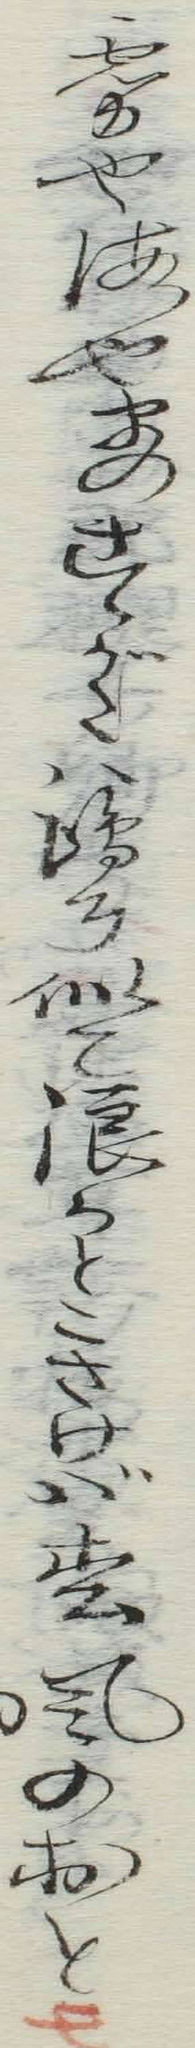霧や海やまのすがたは嶋に似て浪かとこさけば松風のおとモ
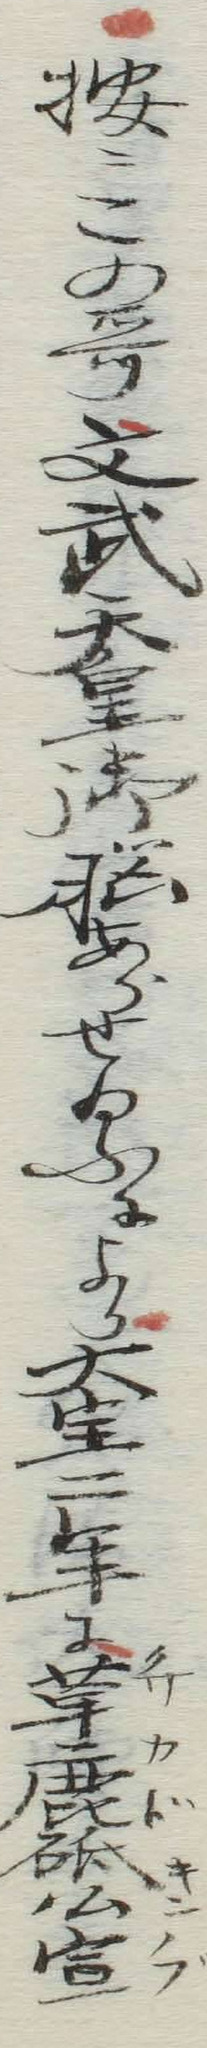●按ニこの歌、文武天皇御脳あらせ給ふにより、大宝二年に、草鹿砥公宣
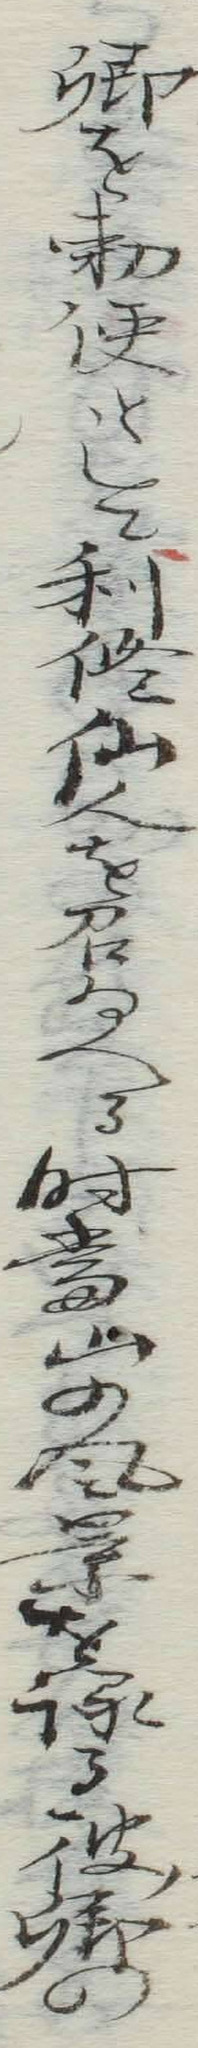卿を勅使として、利修仙人を召給へる時当山の風景を詠る彼卿の
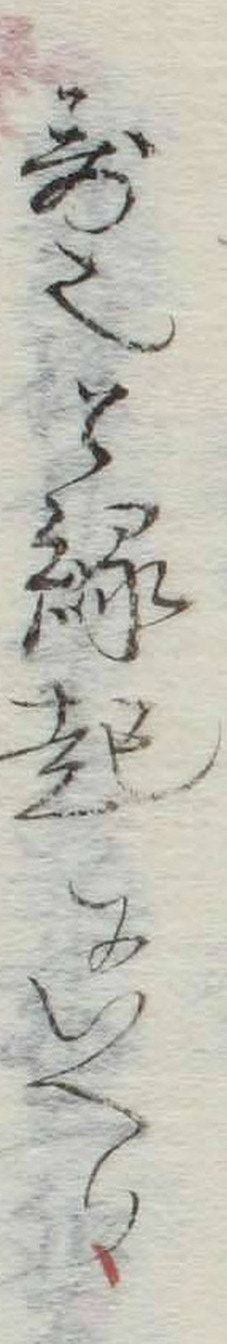歌也と縁起にいへり、
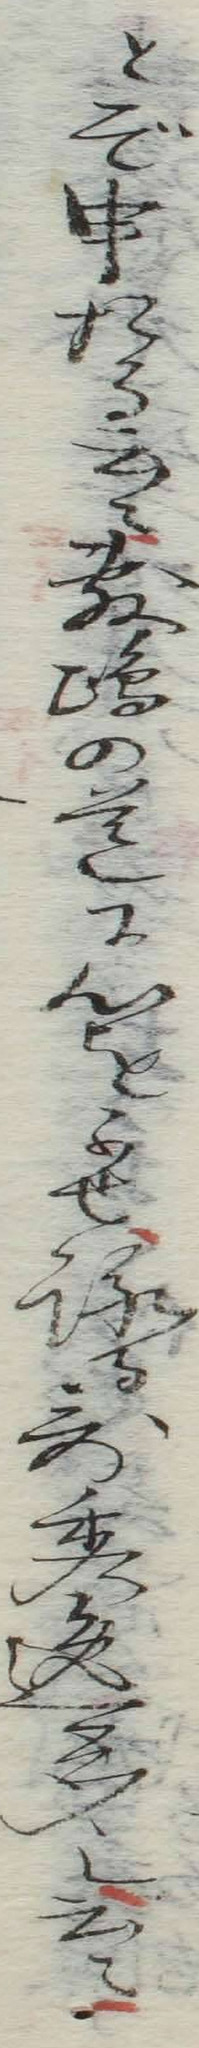とぞ申たる云々、敷島の道に心をよせ、詠る歌秀逸多し、云々、

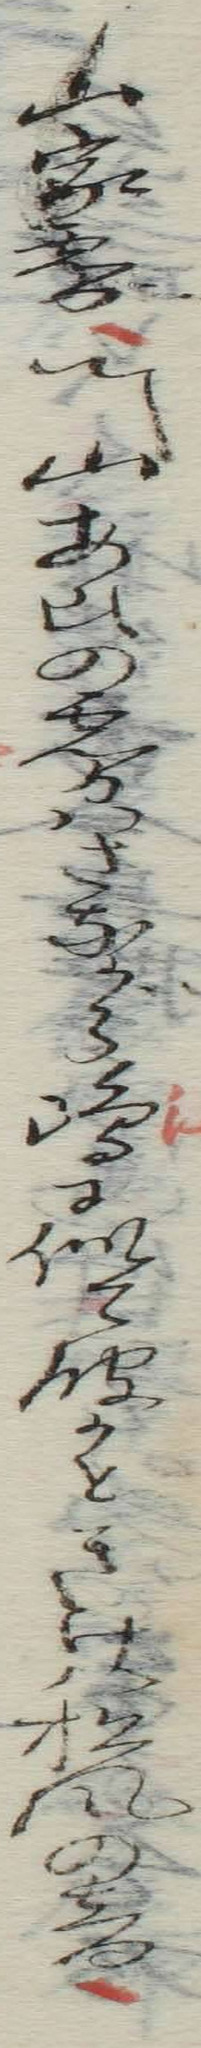山家霧、〽山あひの霧はさながら嶋に似て波かときけは松風の音、
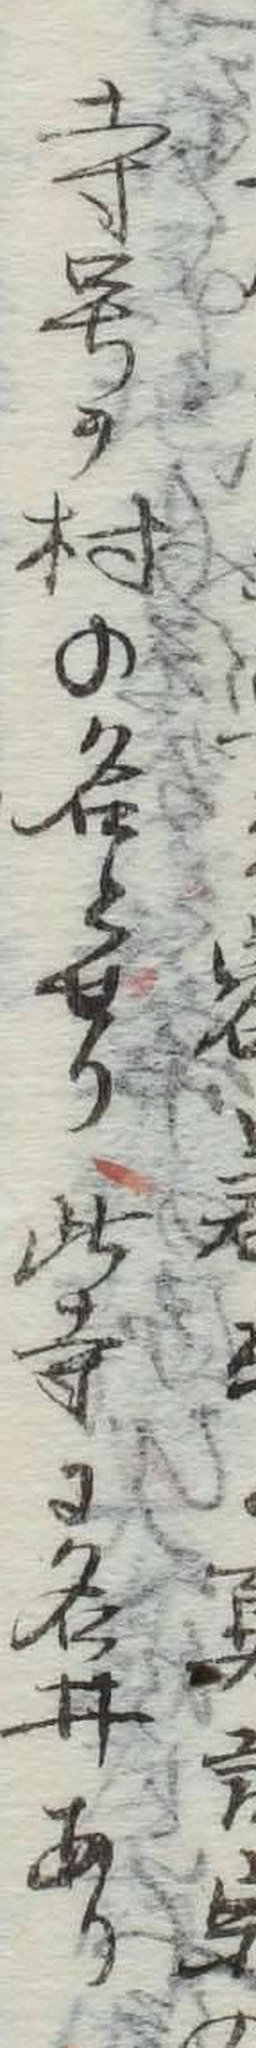寺号ヲ村の名とせり、此寺に名井あり、
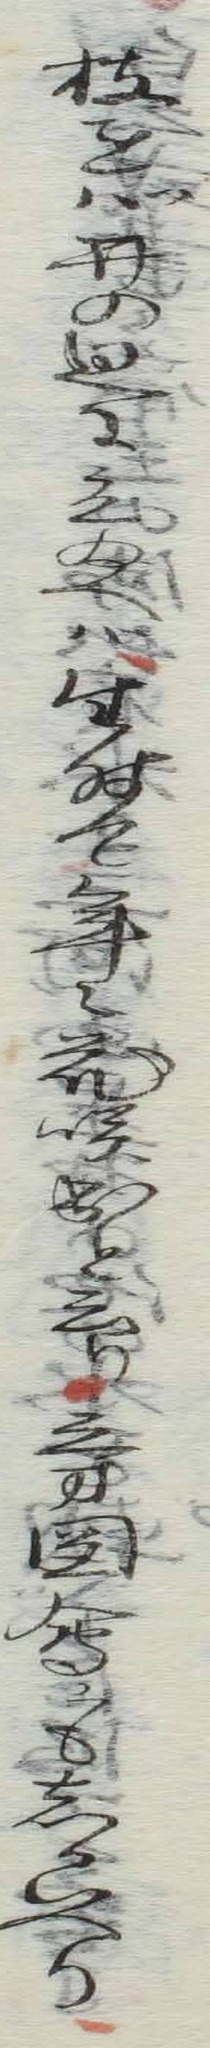枝をば井の辺に立給へば、生付て年々花咲出と云り●三才図会ニもしかいへり、
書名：三河国古跡考
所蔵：国文学研究資料館
